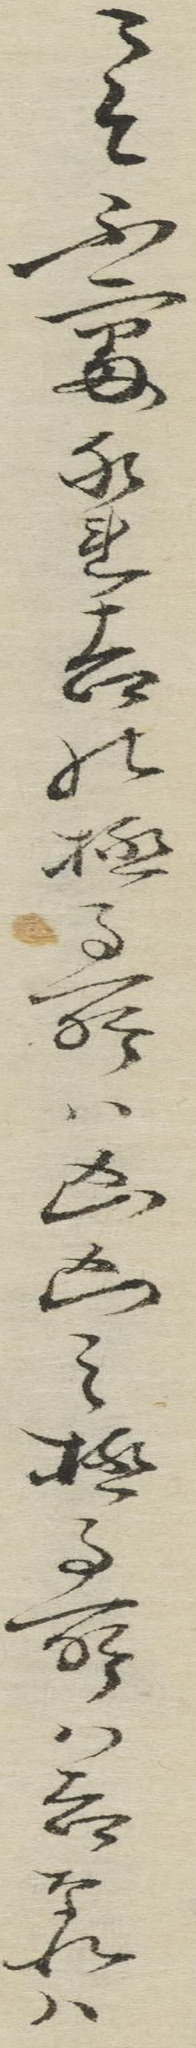ニて不審なれ吉の極所ハ凶凶之極所ハ吉なれハ
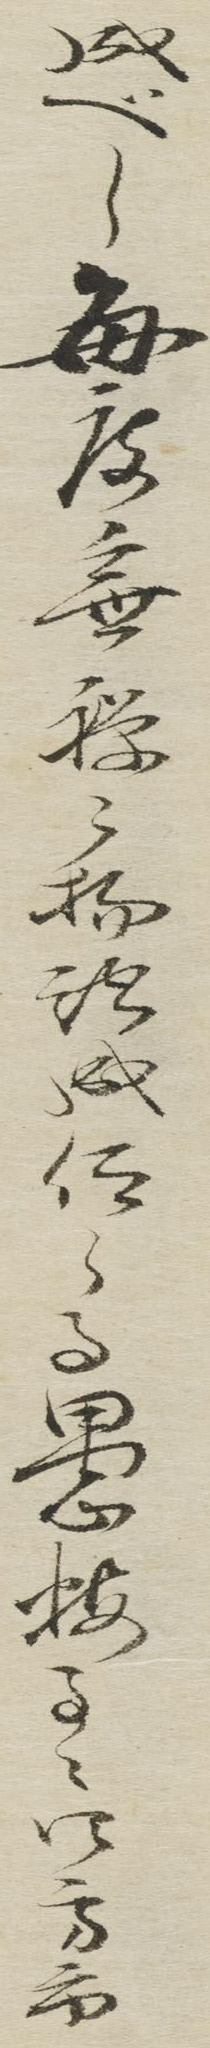成べし毎度無禅之物語成仰らる愚按るニ四方市
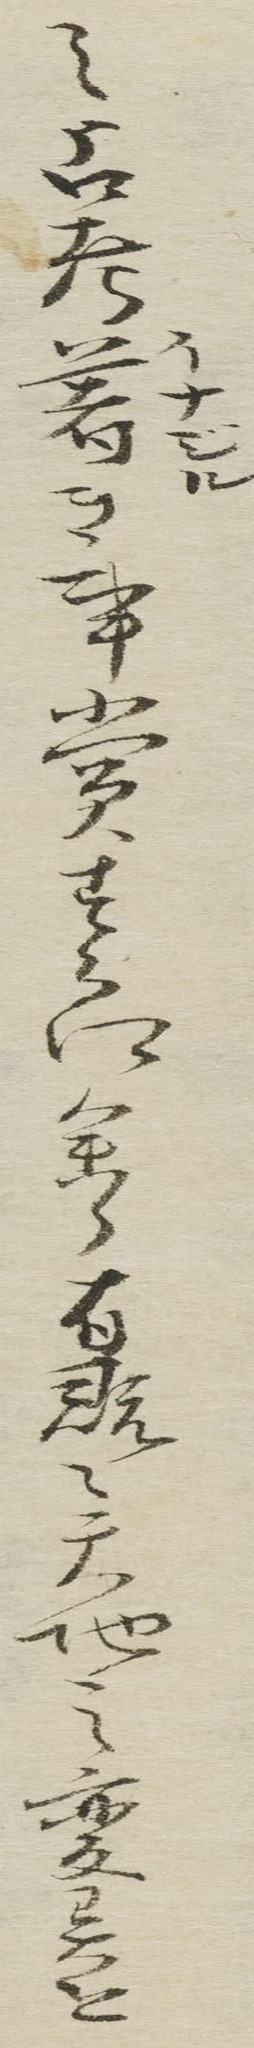之占考著ジル）き事賞するに余り有既ニ天地之変異を
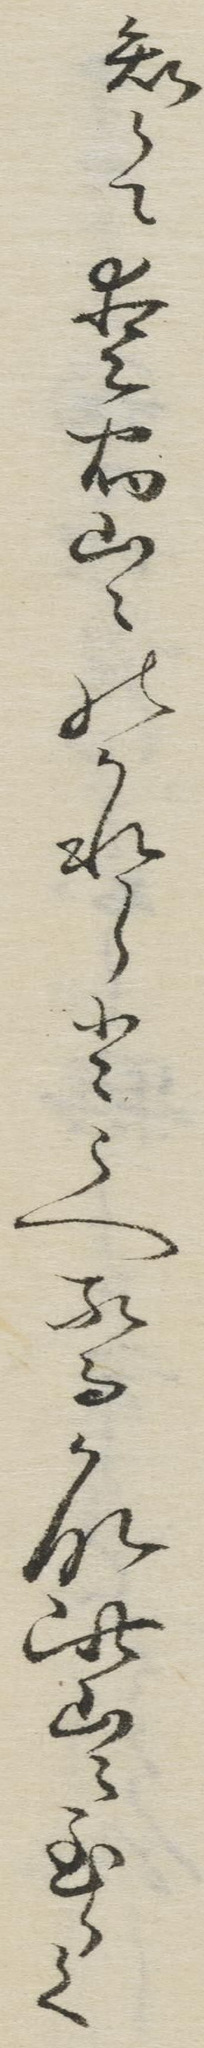知りて愛宕山々のかれしとうへなるかな此山々至りて
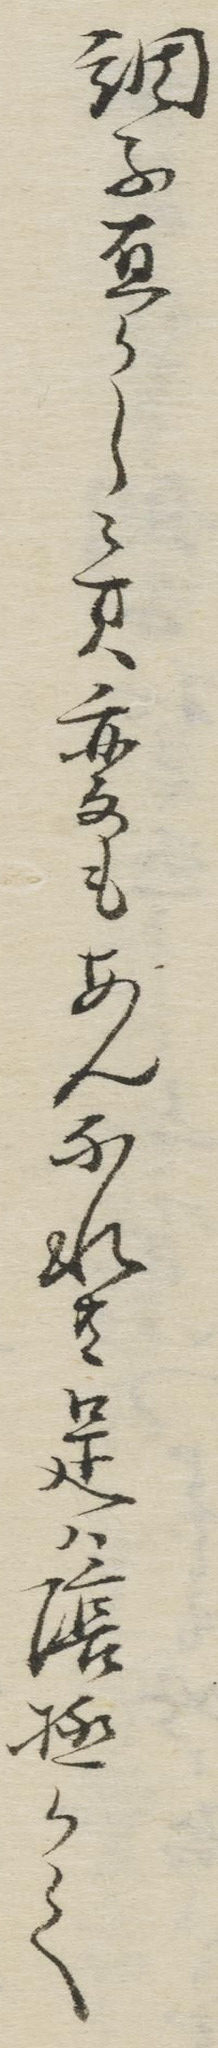調子有りしニ其変もあんなれ共是ハ陰極りて
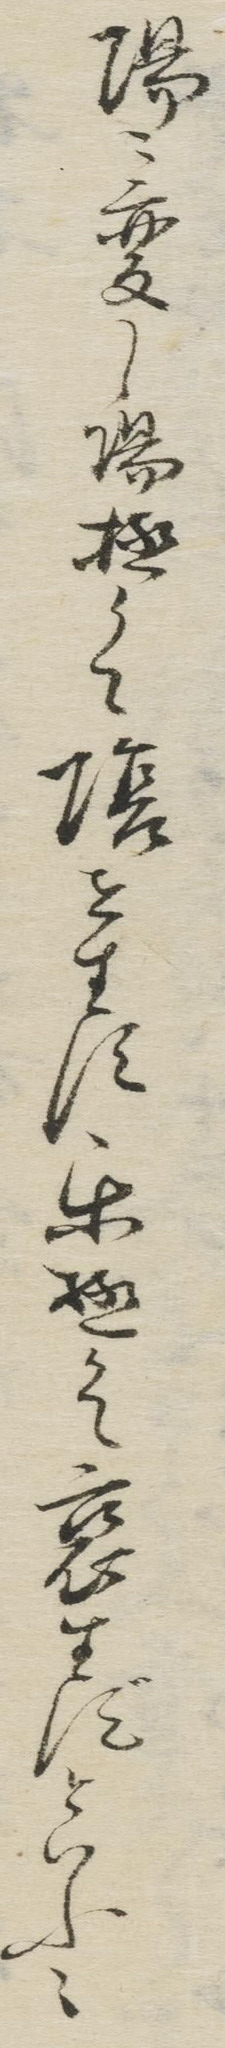陽ニ変し陽極りて陰を生ず互極にて哀生ずといふニ
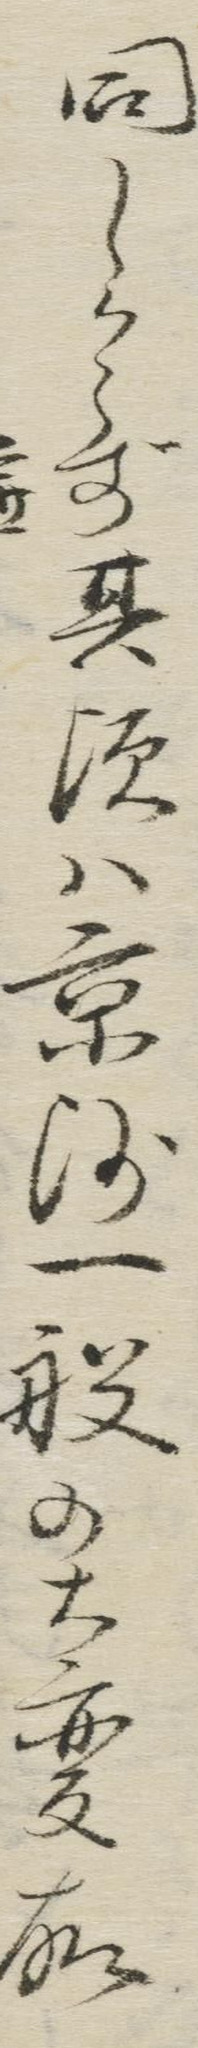同じからず其頃ハ京州一般の大変故
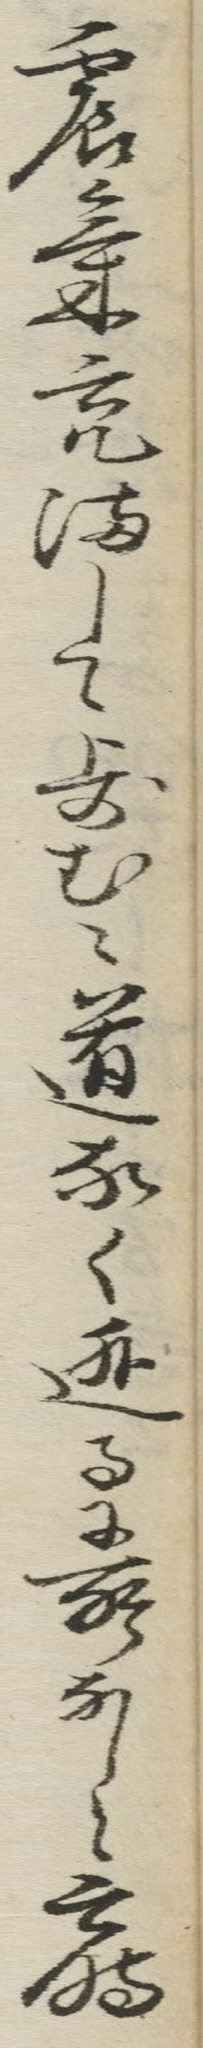震気充満して歩むニ道なく逃るに所なし其時
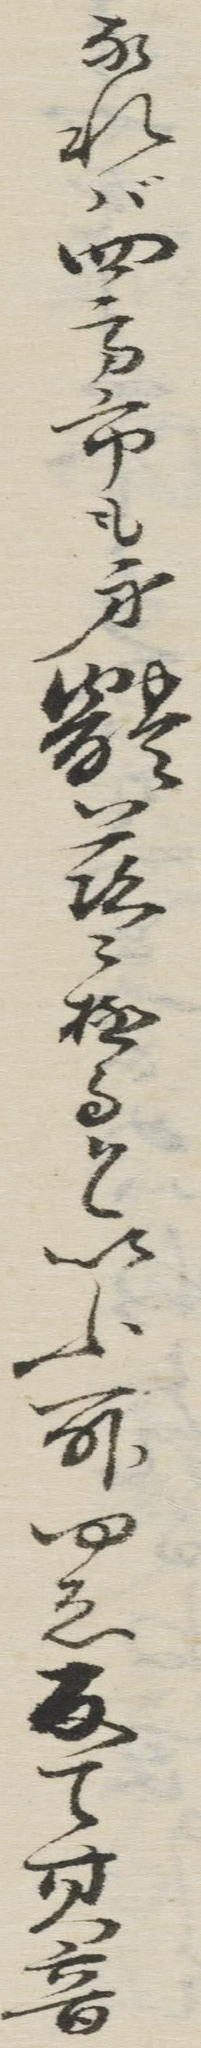なれバ四方市も身体茲ニ極るといふ所ゆえ反て其音
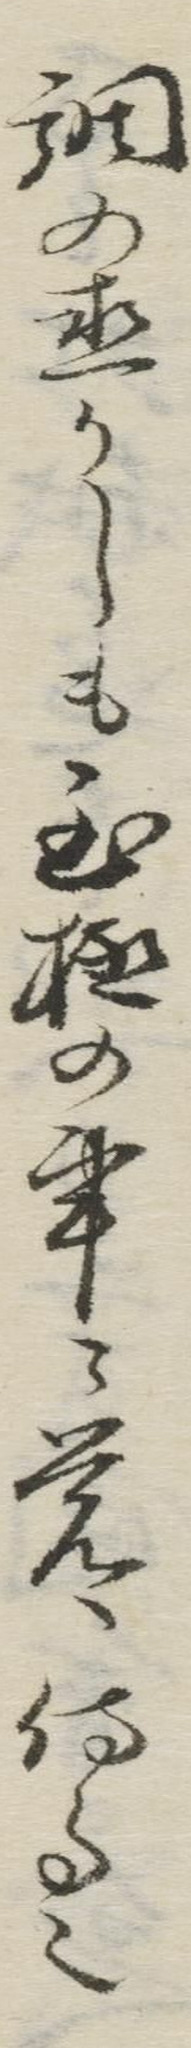調の直りしも至極の事ニ覚へ侍る也
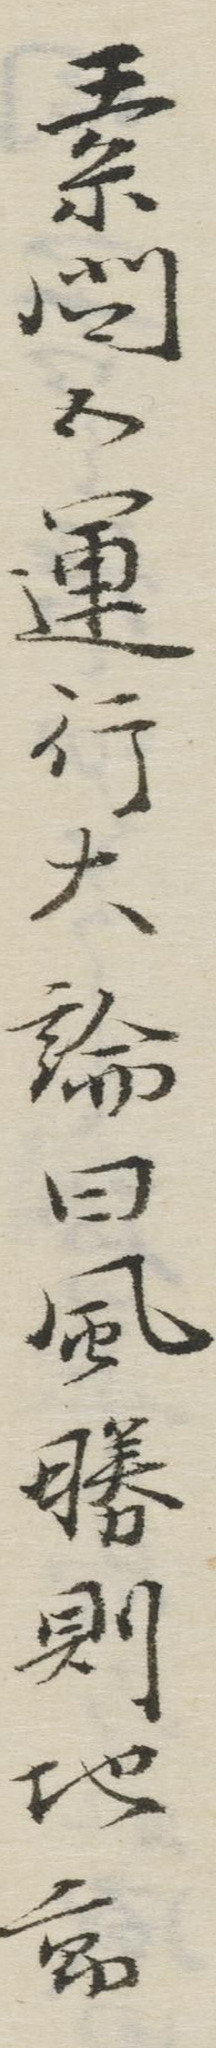素問五運行大論曰風勝則地動
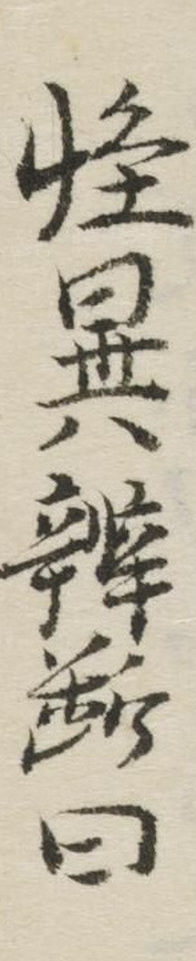怪異弁断曰
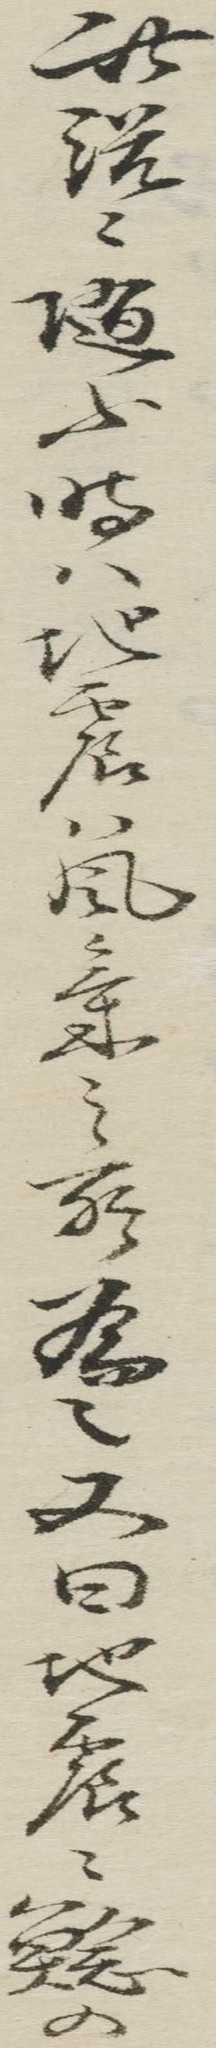此説ニ随ふ時ハ地震ハ風気之所為也又曰地震ニ鯰の
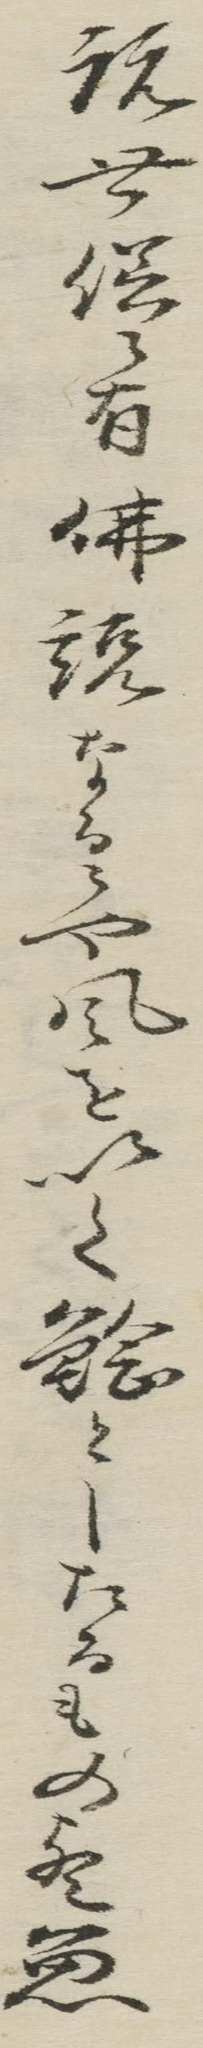説世俗に有佛説なるニや風を以て鯰としたるもの歟魚

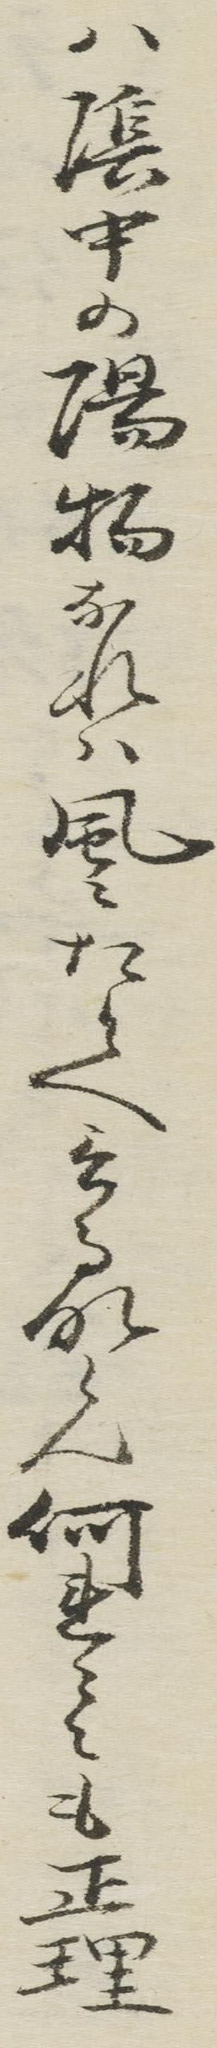ハ陰中の陽物なれハ風ニたとへ言るならん何れニても正理
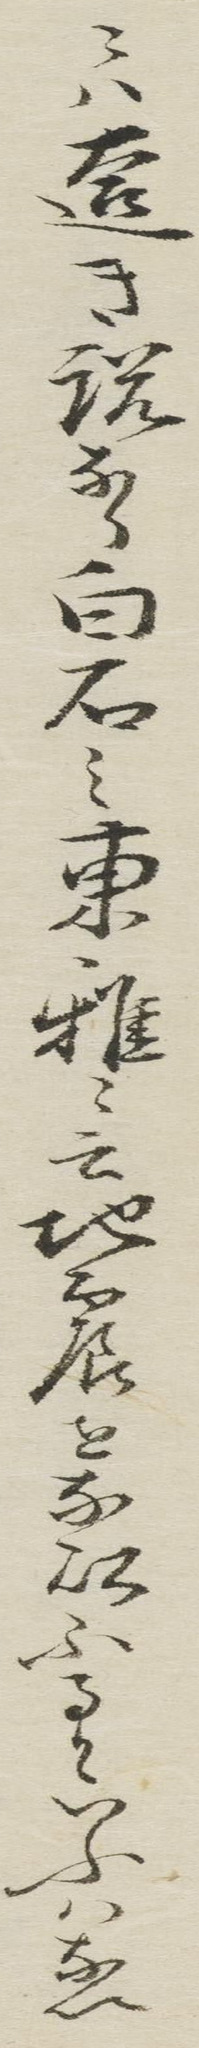ニハ遠き説なり白石之東雅ニ云地震をないふるといふハない
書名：諸国大地震大津波一代記
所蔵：東京大学地震研究所図書室 Earthquake Research Institute Library, The University of Tokyo, JAPAN
